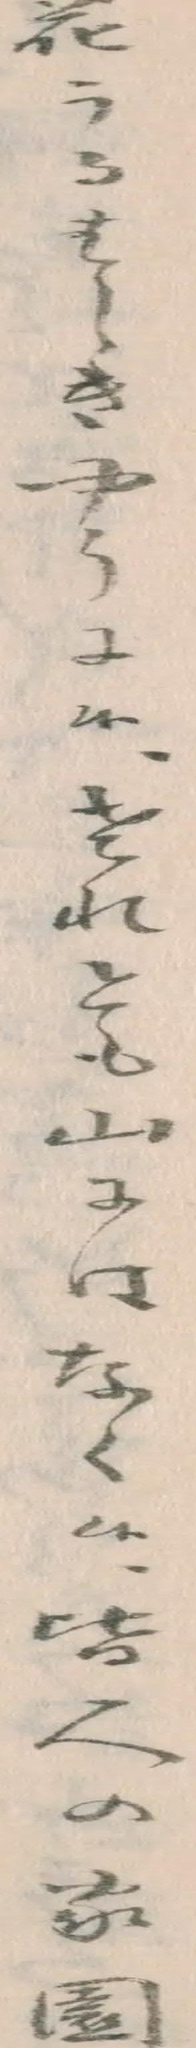花うるはしきやうに候、されとも山にはなく候、皆人の家園
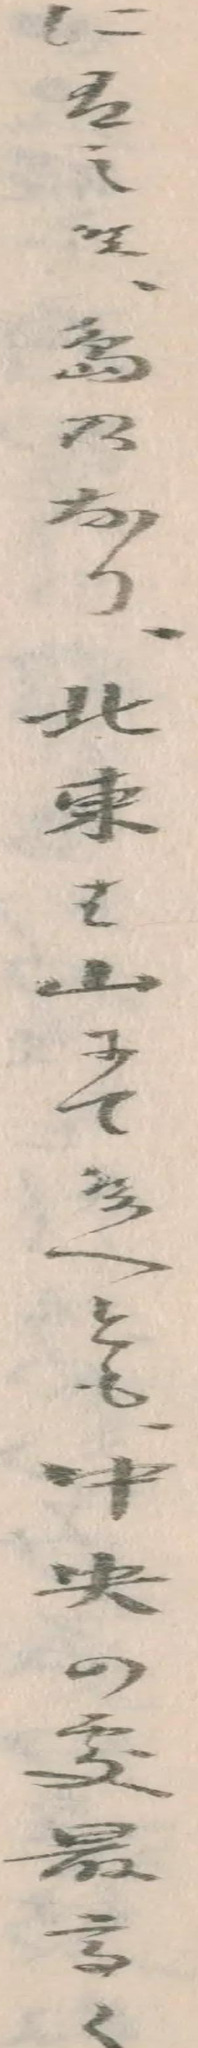に有之候、島のなり、北東は山にて候へとも、中央の処最高く
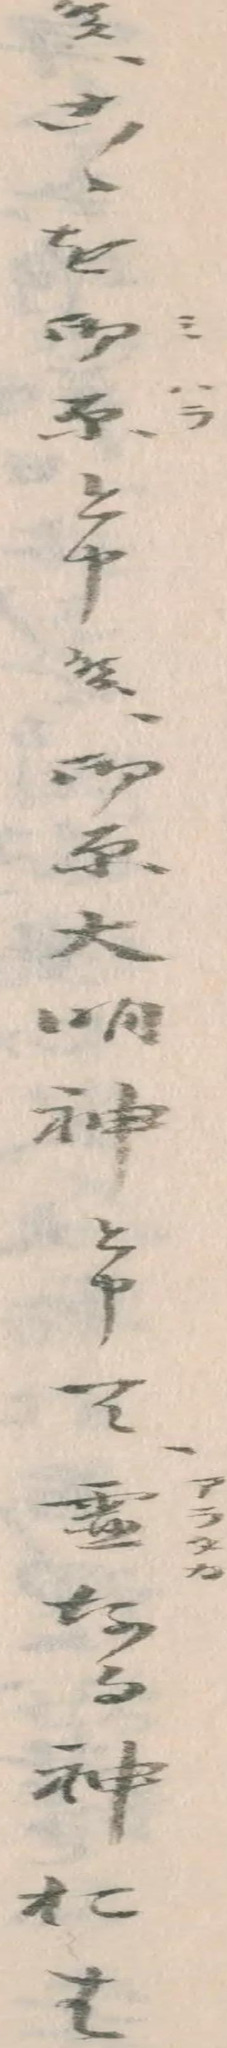候、こゝを御原と申候、御原大明神と申て、霊なる神おは
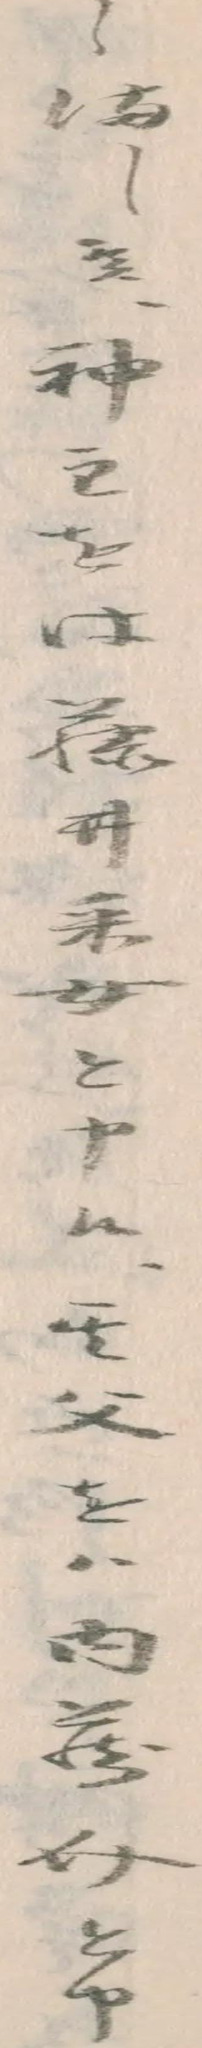しまし候、神主をは藤井采女と申候、其父をは内蔵介と申
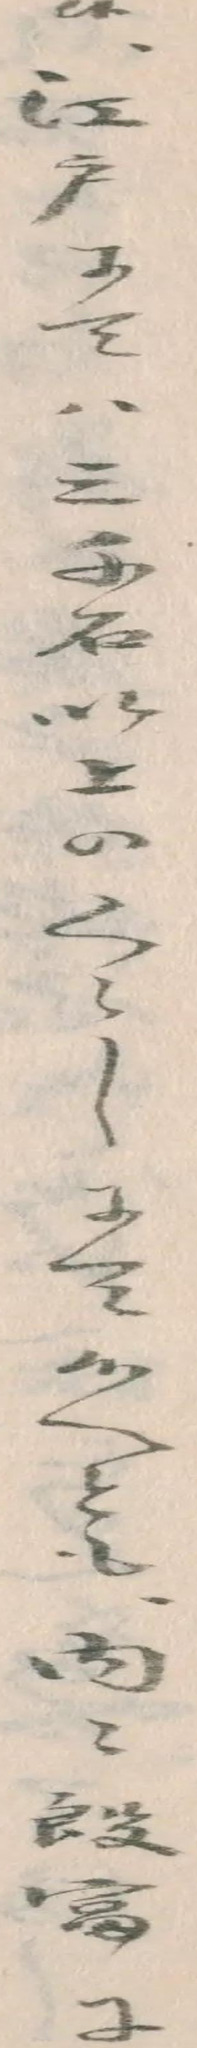候、江戸にては三千石以上のくらしにて候へとも、内々殷富に
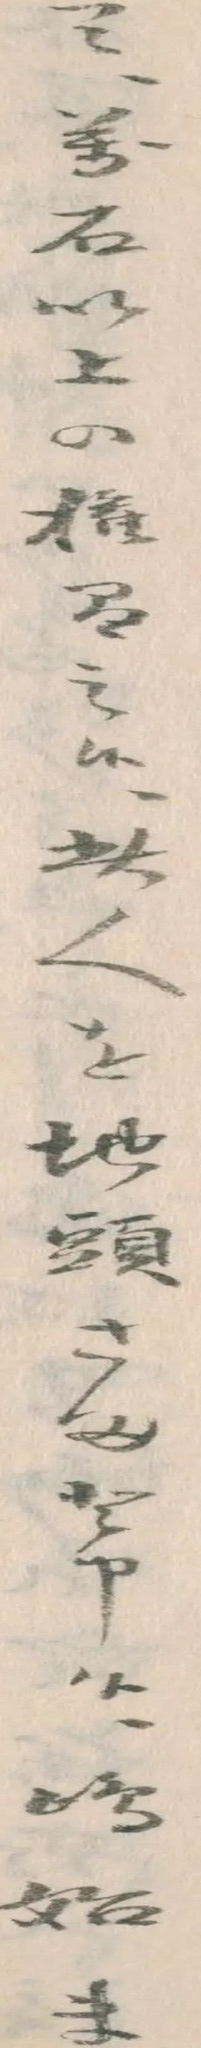て、万石以上の権召し候、此人を地頭さまと申候、嶋始ま
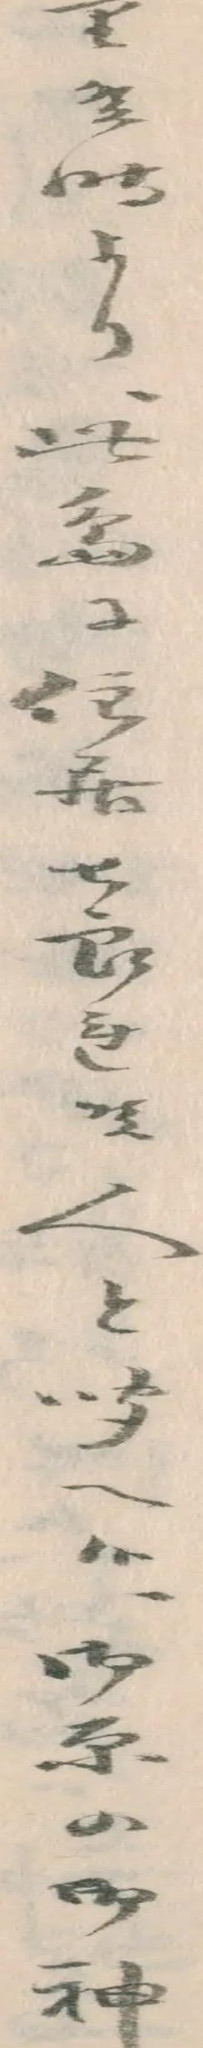り候時より、此島に住居せられ候人と聞へ候、御原の御神

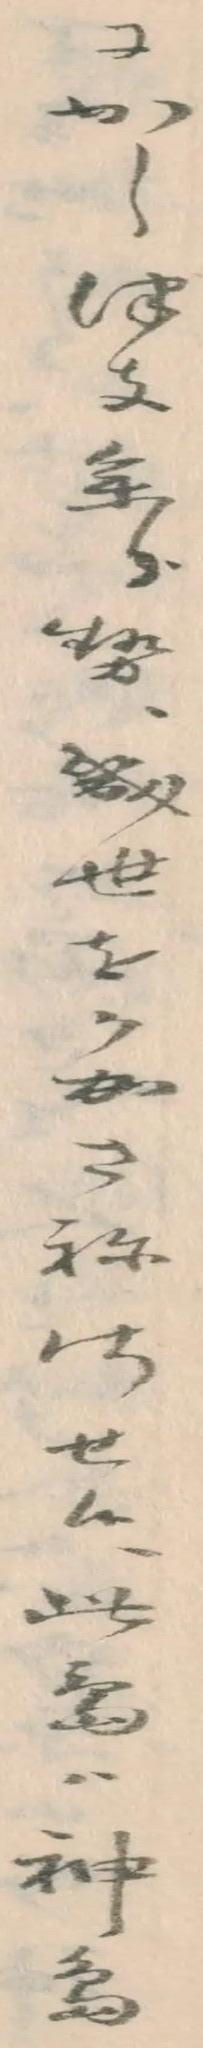にかしつき参らせ、幾世をかかさねさせ候、此島は神島
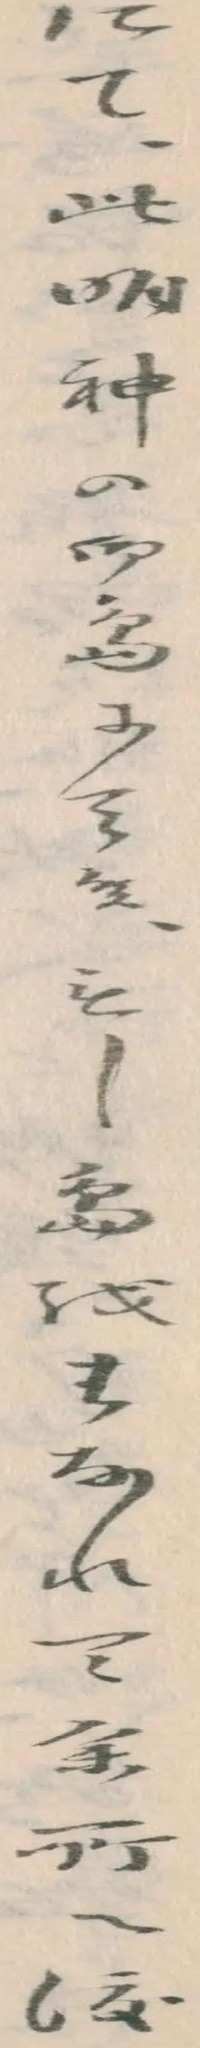にて、此明神の御島にて候、もし島をはなれて余所へ渡
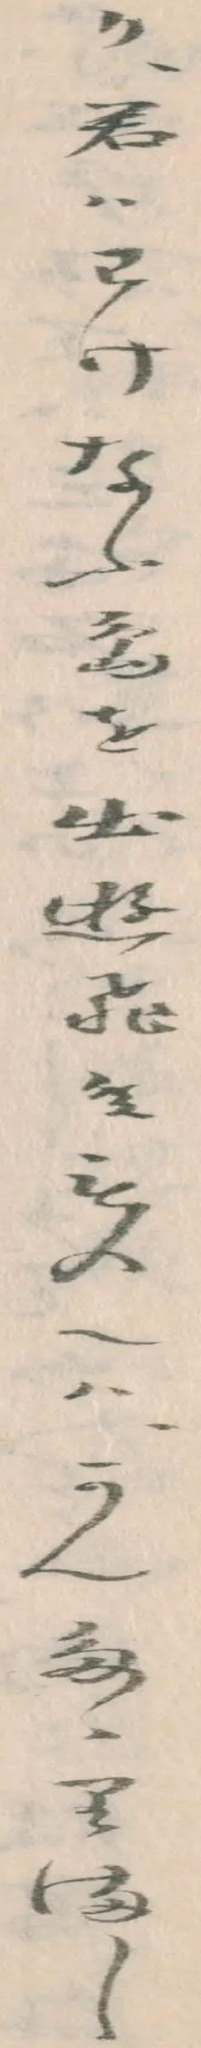り、若はわけなふ島を出遊ひ候ものへは、かんたゝりまし
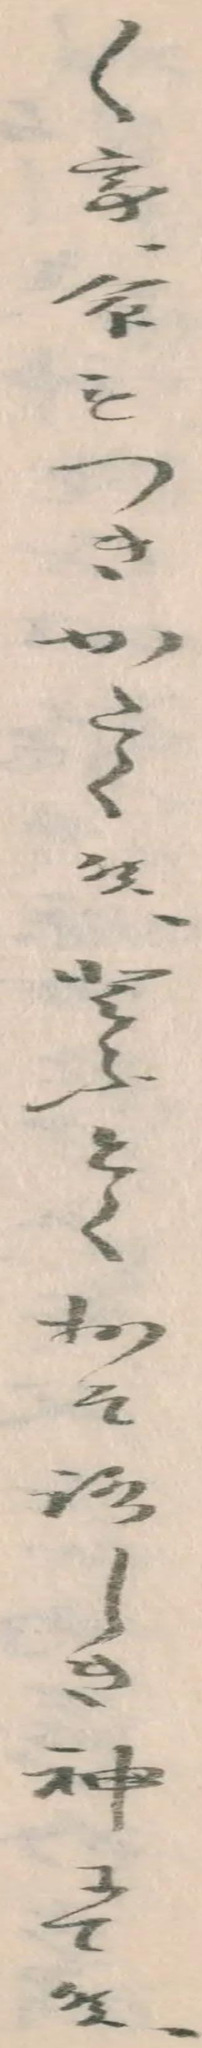〳〵て、命もつきかたく候、とふとくおそろしき神にて候、
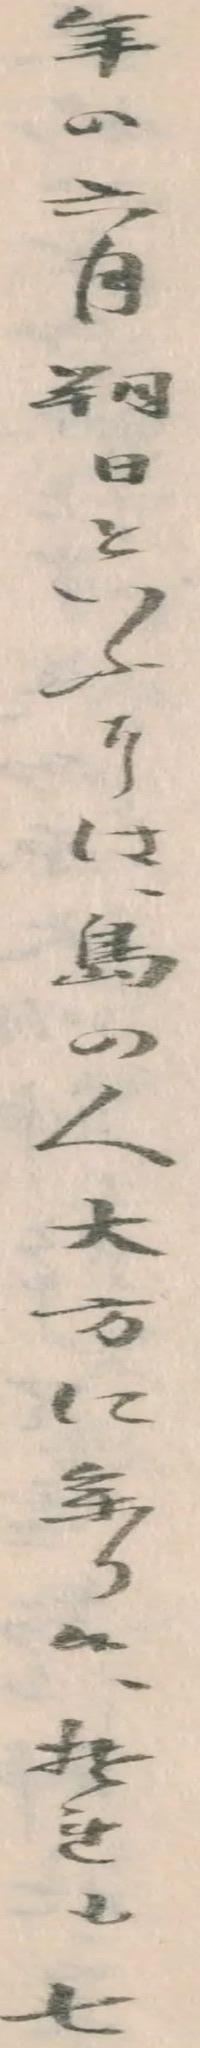年の六月朔日といふには島の人大方に参り候、それも七
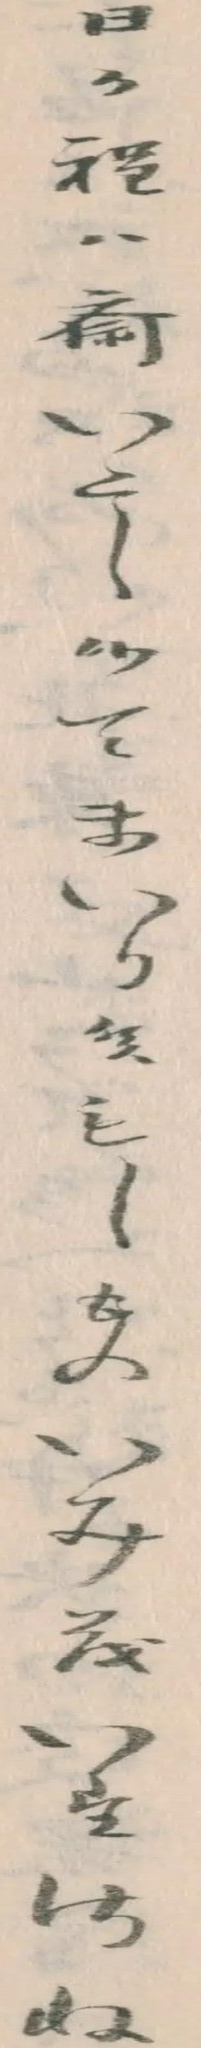日か程は斎いたし候てまいり候もしものいみもいたさね
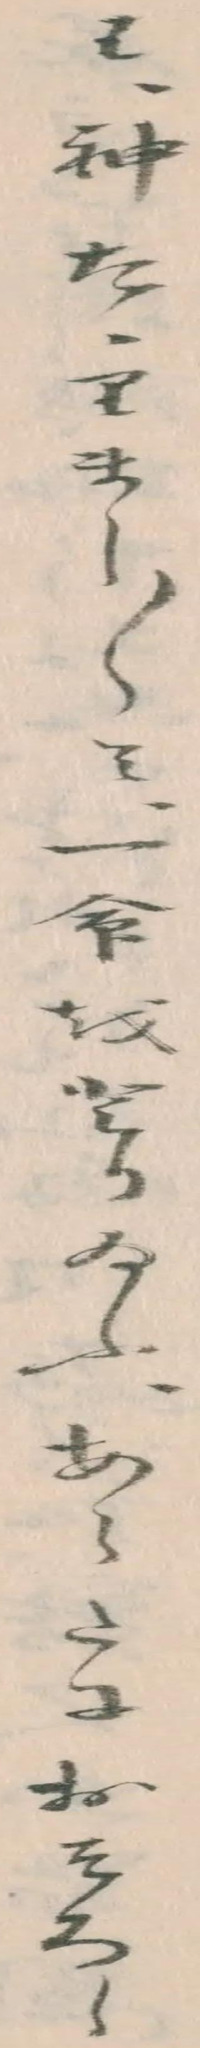は、神たゝりまし〳〵て、一命をとり給ふ、あらたにおそろし
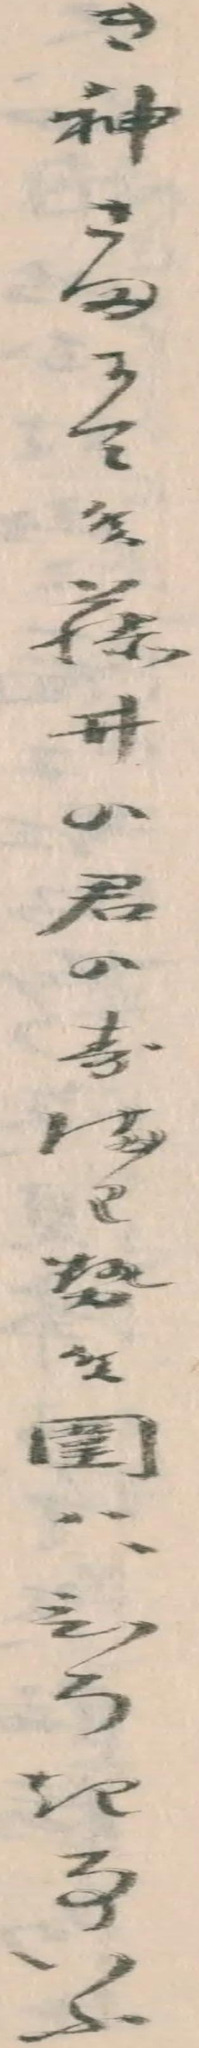き神さまにて候藤井の君のすまわせ候囲は、ひろき事いふ
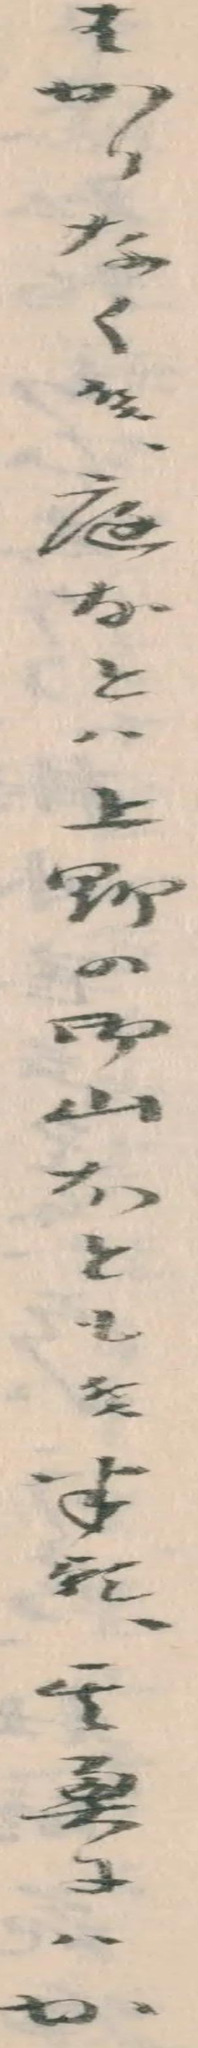はかりなく候、庭なとは上野の御山ほとも候半歟、其奥にはか
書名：地災撮要. 巻11-12(地震之部)
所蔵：国立国会図書館 National Diet Library, JAPAN
